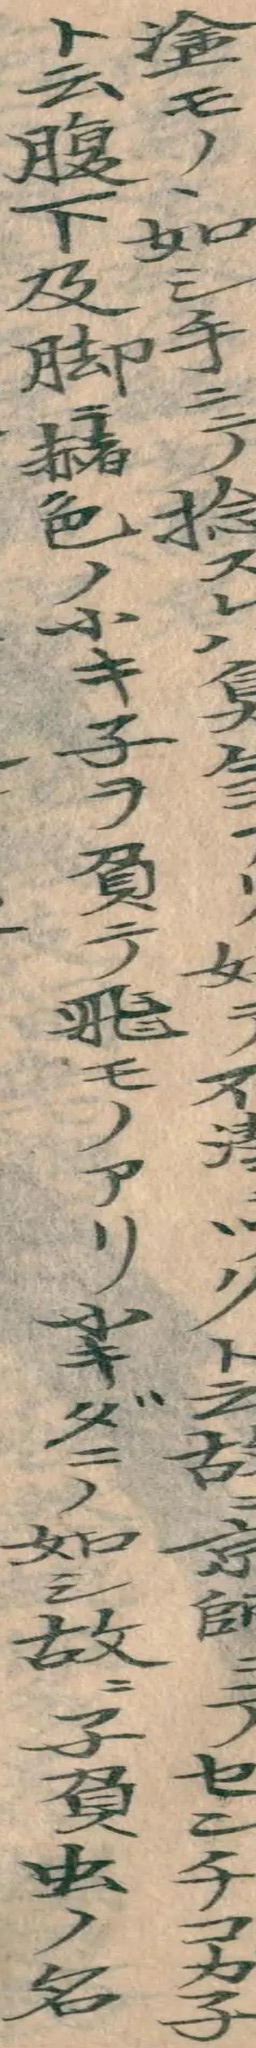ト云腹下及脚ニ赭色ノ小キ子ヲ負テ飛モノアリ小キダニノ如シ故ニ子負虫ノ名
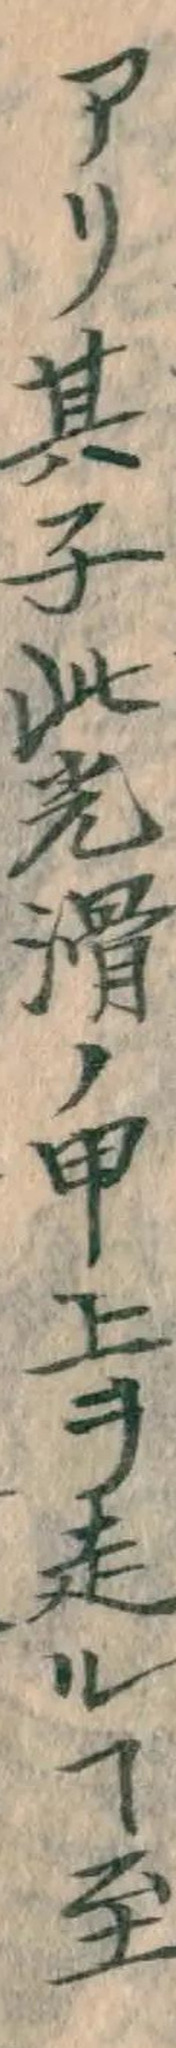アリ其子此光滑ノ甲上ヲ走ルコト至
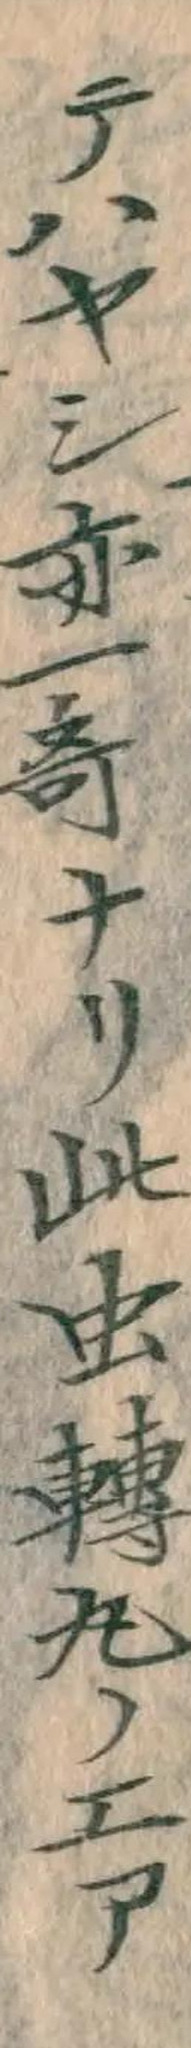テハヤシ亦一奇ナリ此虫転丸ノエア
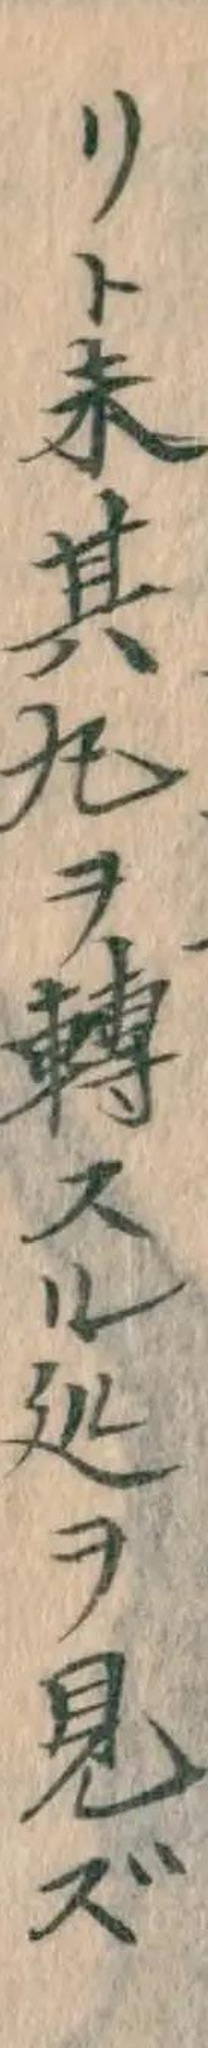リト未其丸を転スル処ヲ見ズ
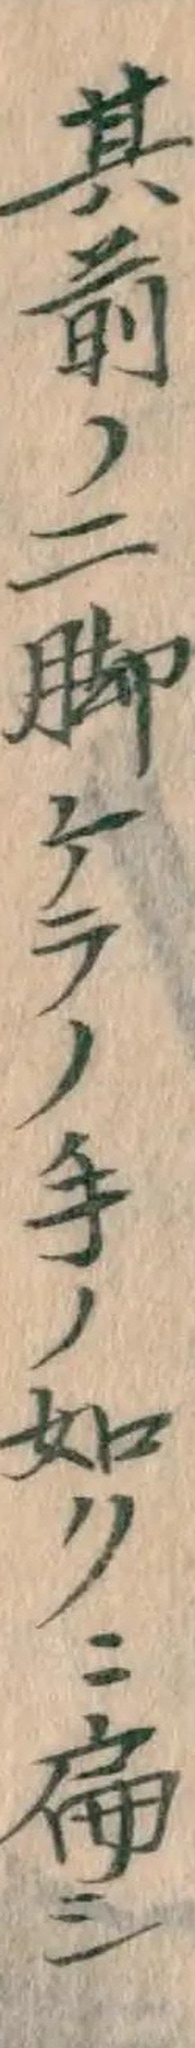其前ノ二脚ケラノ手ノ如クニ扁シ
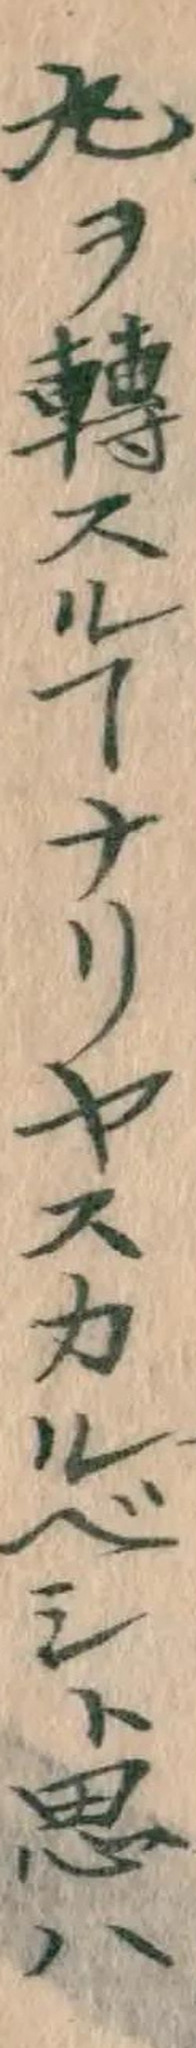丸ヲ転スルコトナリヤスカルベシト思ハ
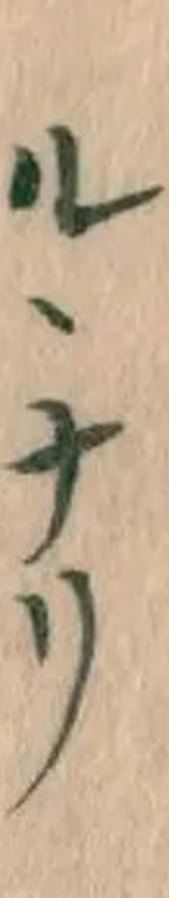ルヽナリ
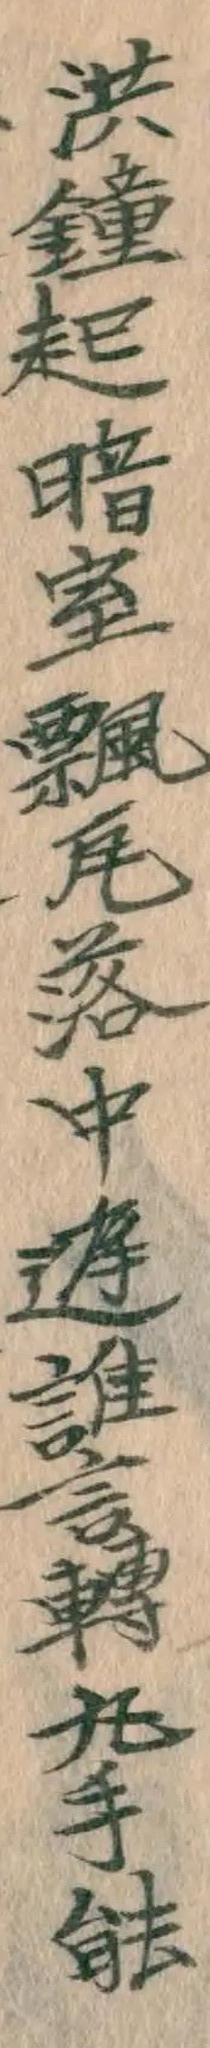洪鐘起暗室飄瓦落中誰言轉丸手能
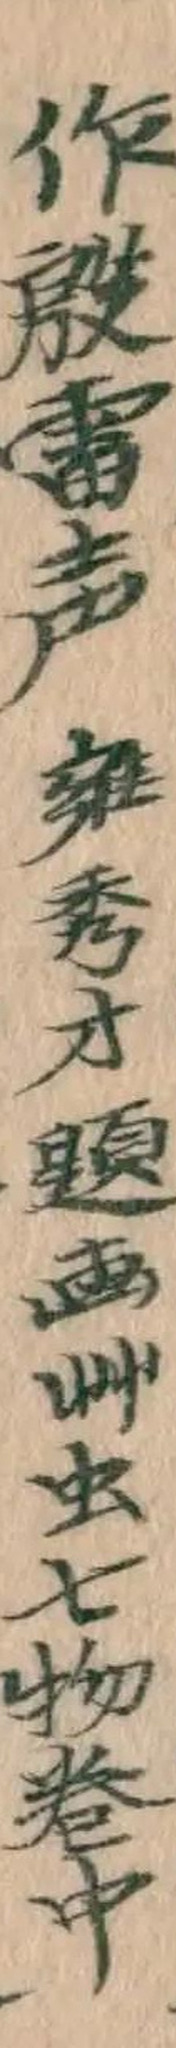作殷雷聲雍秀才題画草虫七物巻中
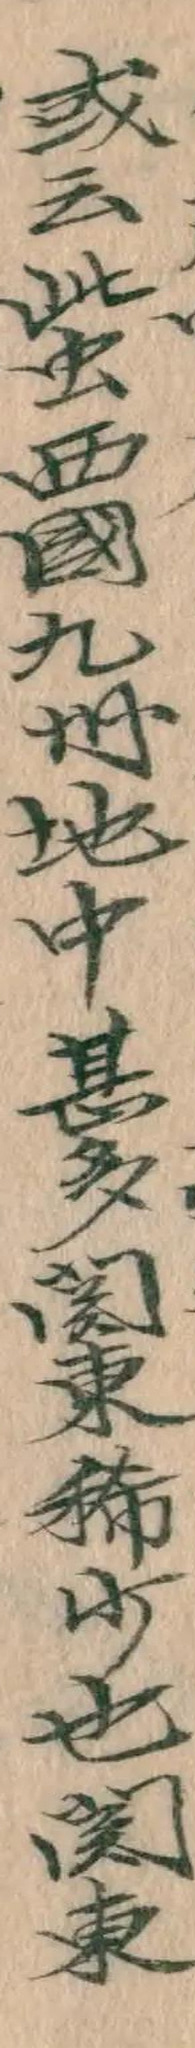或云此虫西国九州地中甚多関東稀少也関東
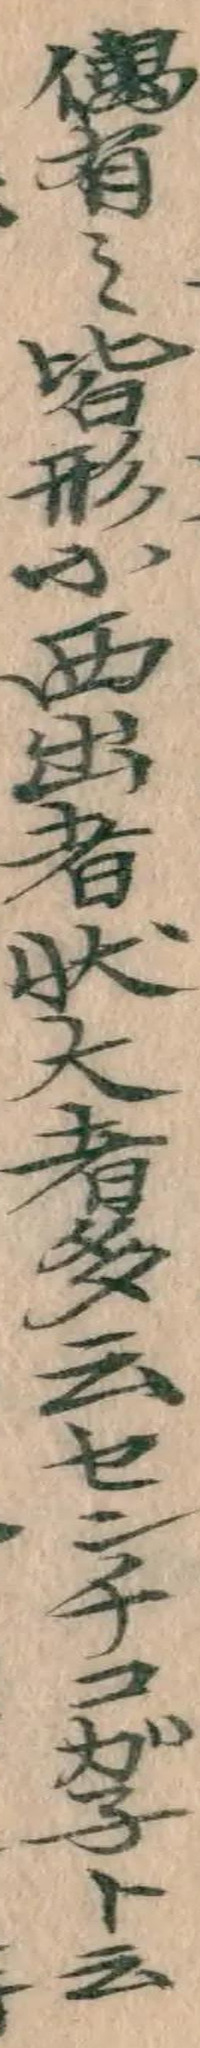偶有之皆形小西出者状大者多云センチコガネト云
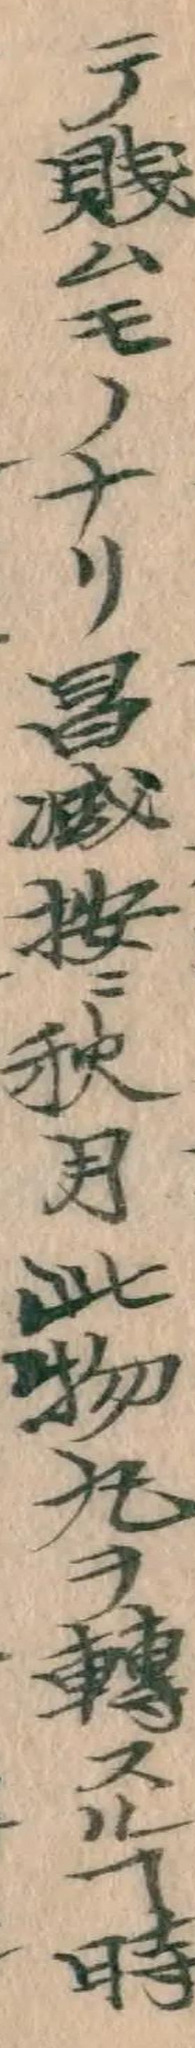テ賤ムモノナリ昌蔵按ニ秋月此物丸ヲ転スルコト時
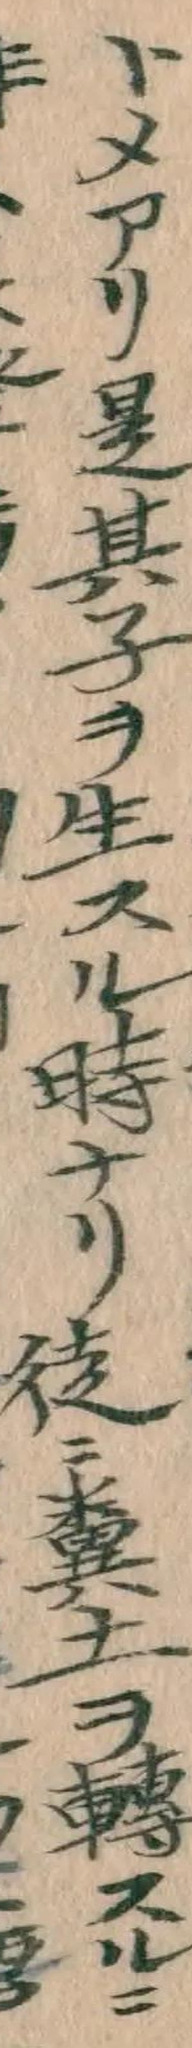トシテアリ是其子ヲ生スル時ナリ徒ニ糞土ヲ転スルニ
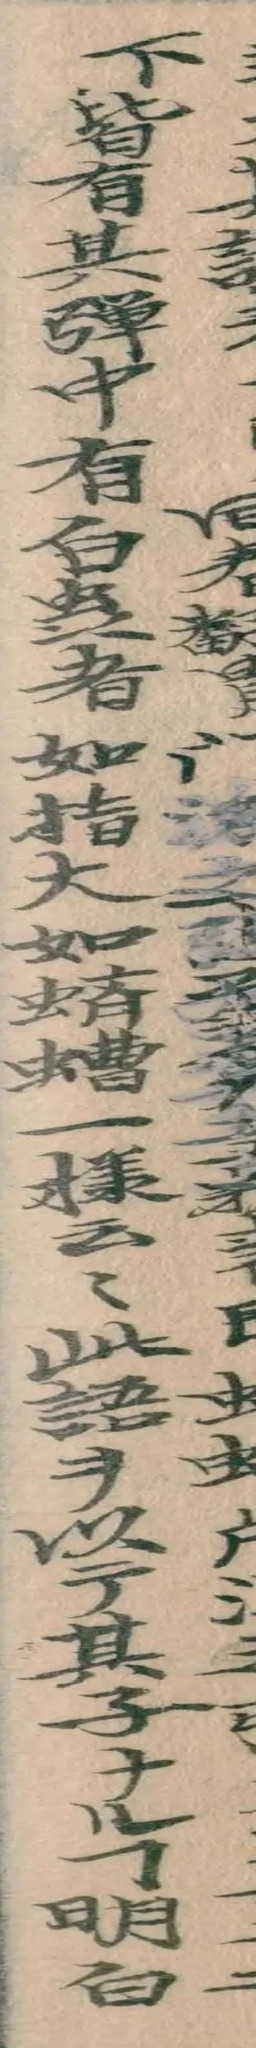下皆有其弾中有白蟲者如指大如蠐螬一様云々此語ヲ以テ其子ナルコト明白
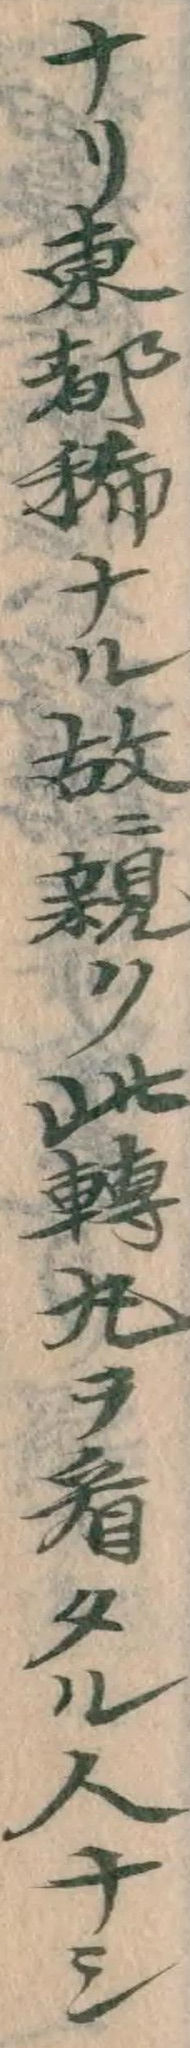ナリ東都稀ナル故ニ親ク此転丸ヲ看タル人ナシ

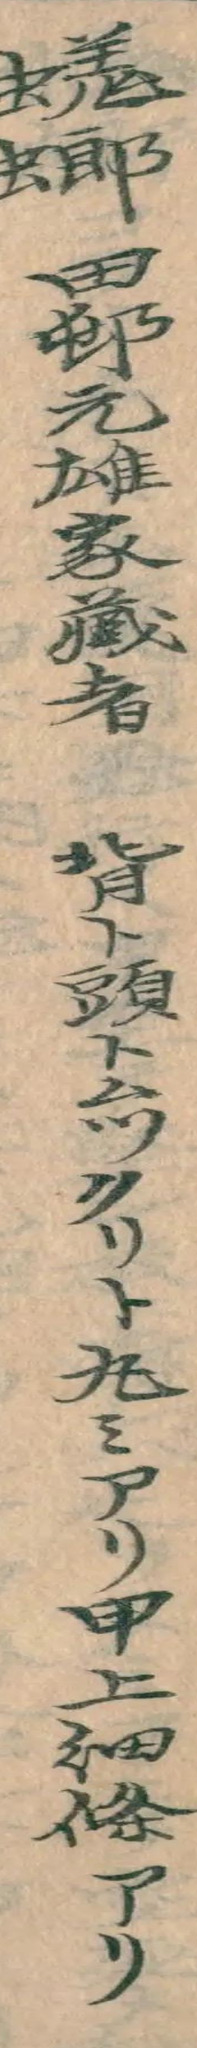蜣蜋田邨元雄家蔵者背ト頭トムツクリト丸ミアリ甲上細條アリ
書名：千蟲譜 3巻. [3]
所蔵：国立国会図書館 National Diet Library, JAPAN
